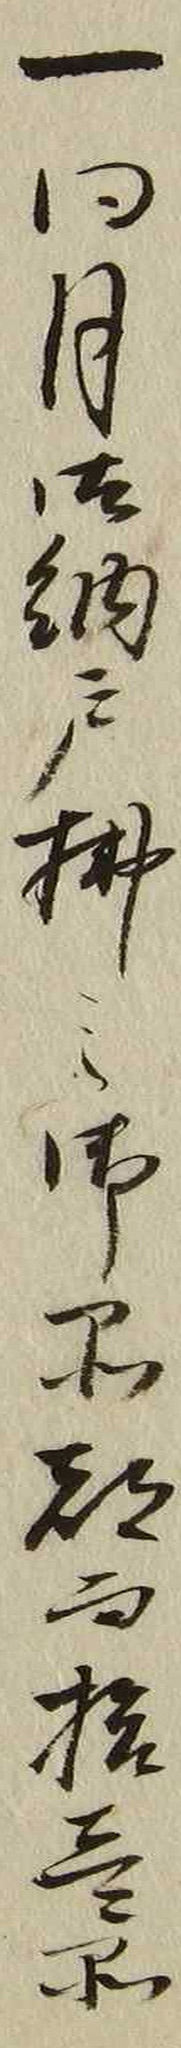一同月御納戸払之御品都而拾壱品
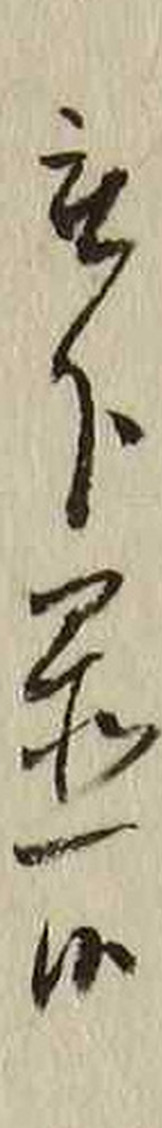被下置候
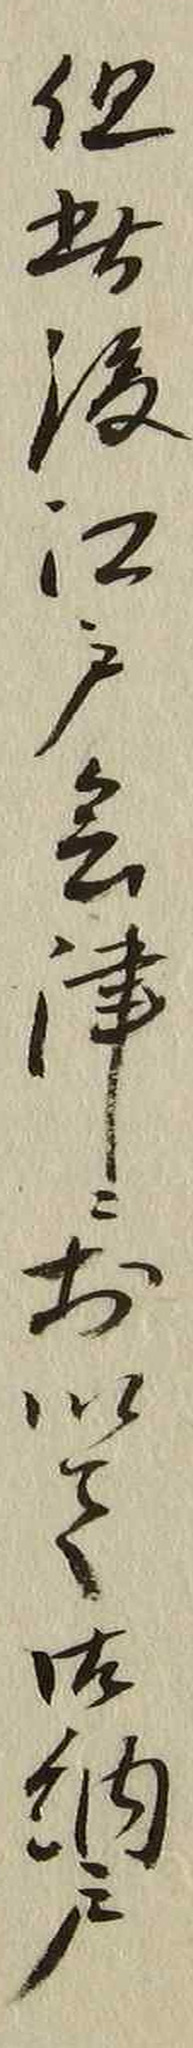但此後江戸会津ニおいて御納戸
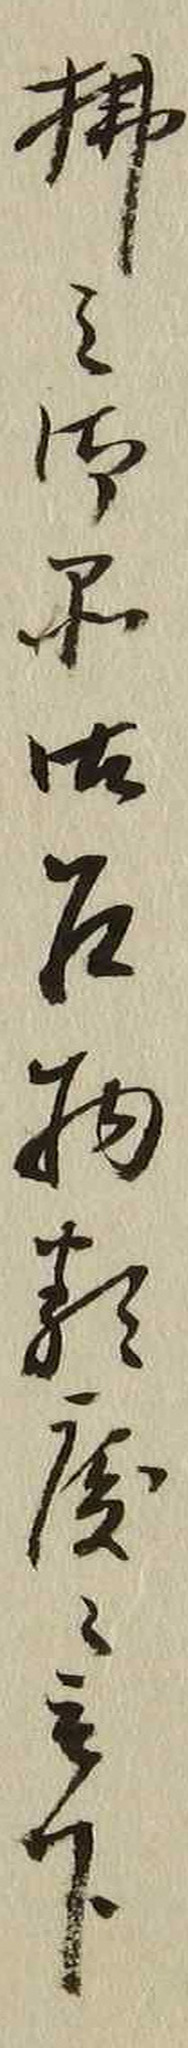払之御品御召物類度々被下
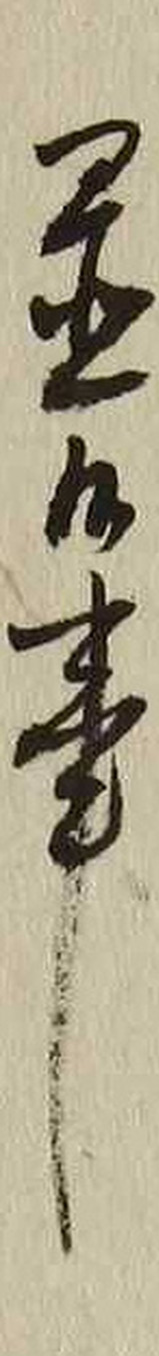置候事
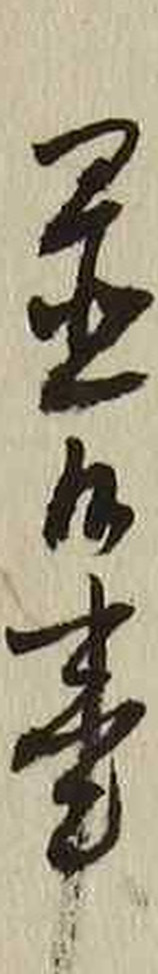置候事
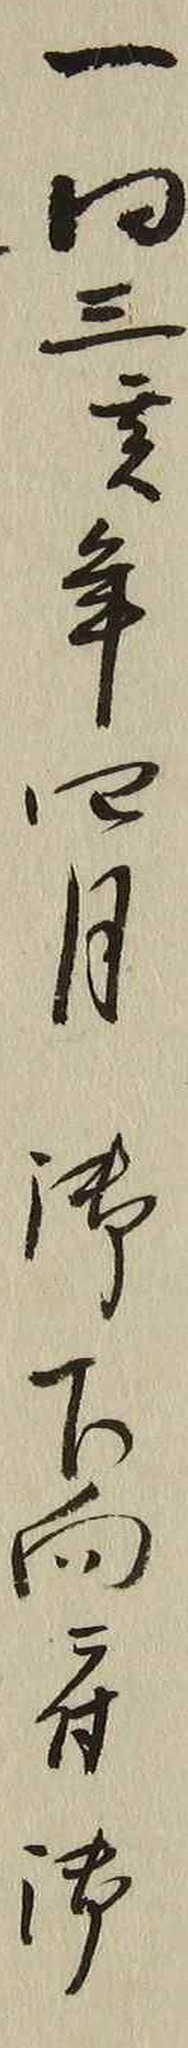一同三亥年四月御下向ニ付御
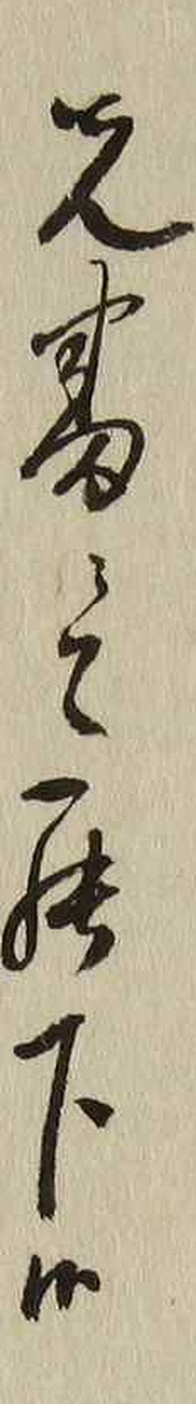先番ニて罷下候
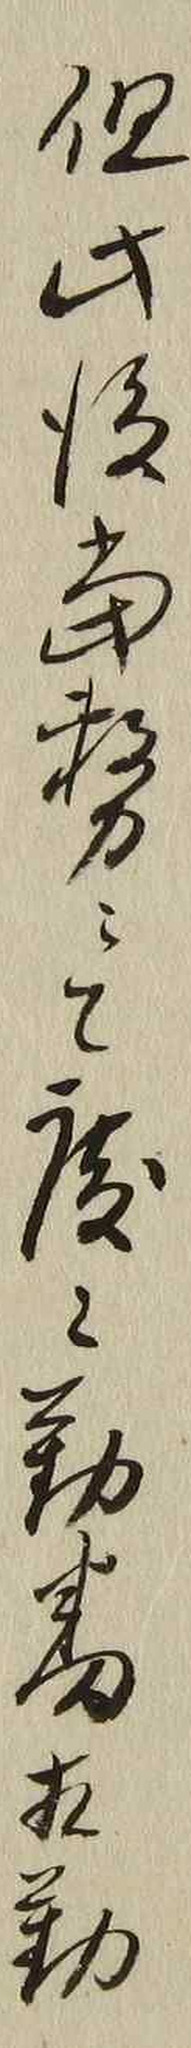但此後当務ニて度々勤番相勤
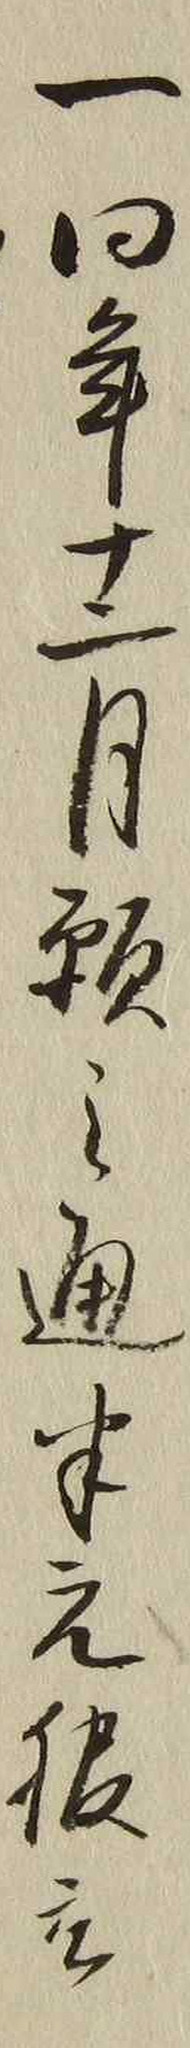一同年十二月願之通半元服被
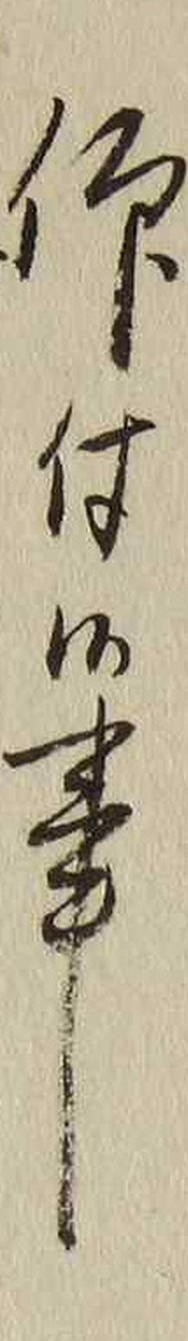仰付候事
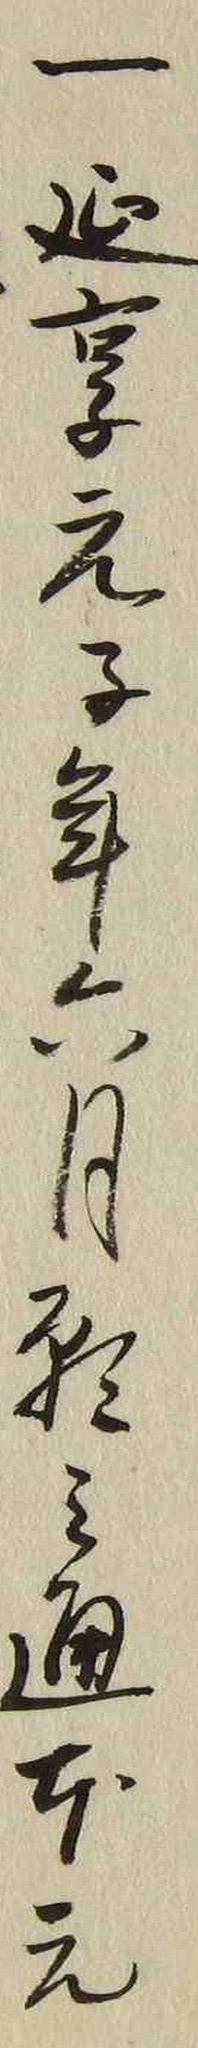一延享元子年六月願之通本元
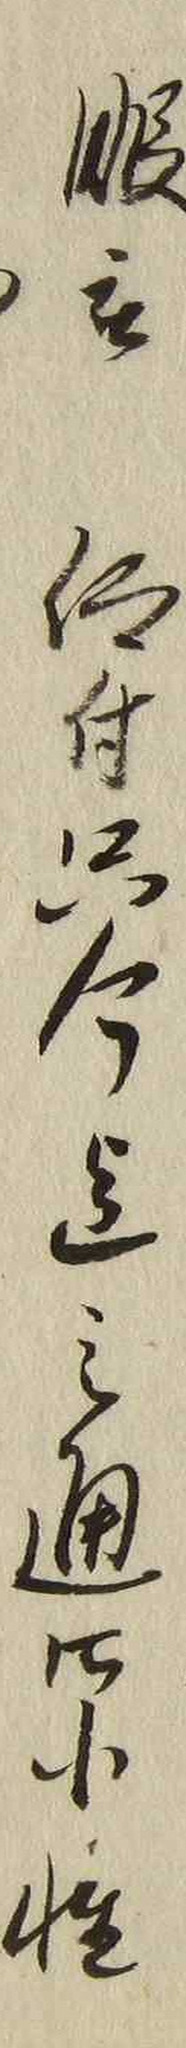服被仰付只今迄之通御小性
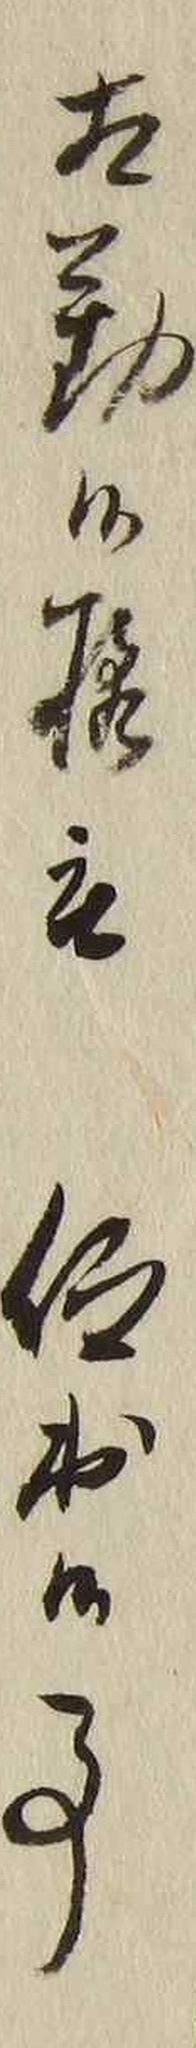相勤候様被仰出候事
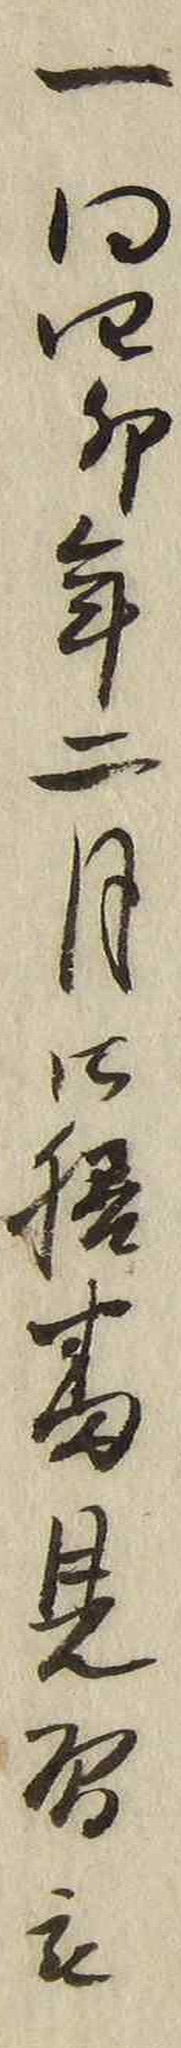一同四卯年二月御膳番見習被

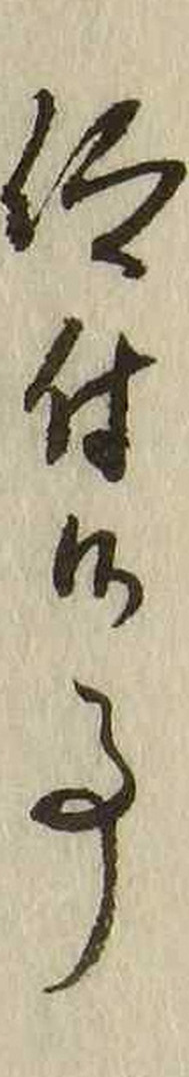仰付候事
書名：諸士系譜　巻之359　す之部9
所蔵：会津若松市立会津図書館
